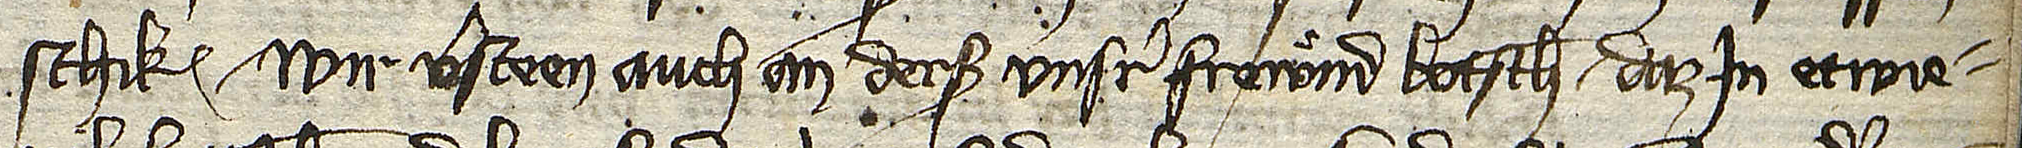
ſchik* / Wir v*ſteen auch an derſ* vnſr* freẅnd botſch* / daʒ In etwie =
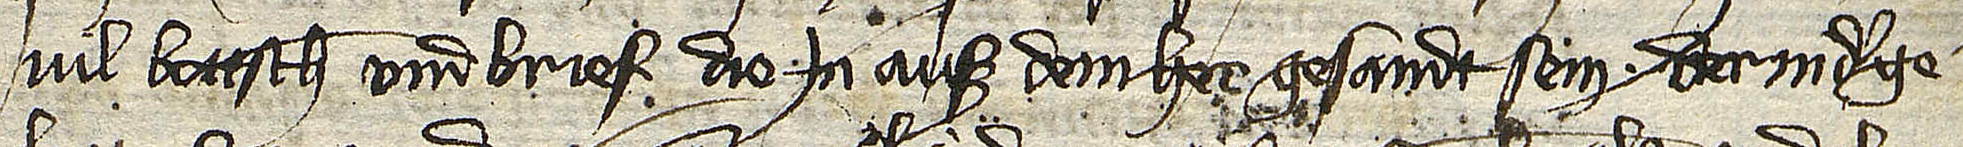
uil bottſch* vnd brief die In auſʒ dem her geſandt ſein . dernid*ge -
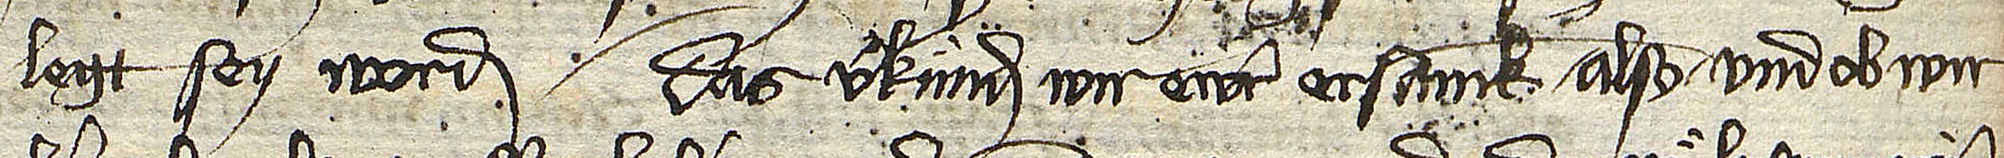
legt ſey word* / Das v*künd* wir eẅr* erſamk* / alſo / vnd ob wir
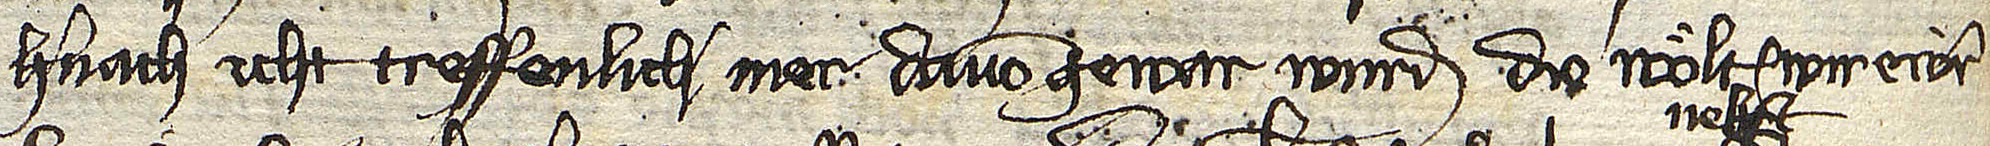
h*nach icht treffenlich* mer dauo* gewar wurd* die wölt* wir eẅr*
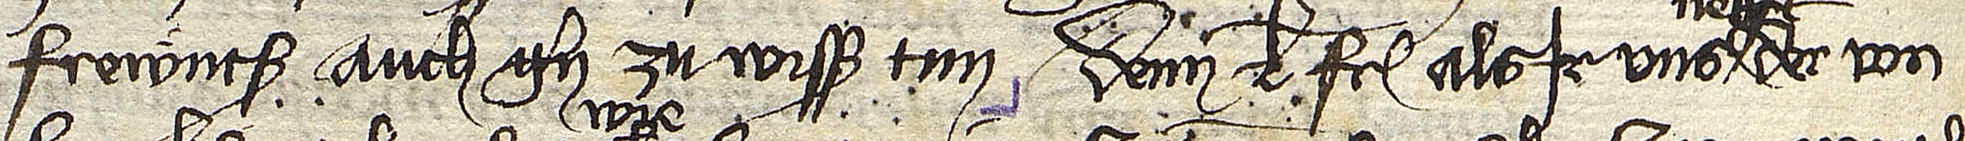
freẅntſ* / auch g*n ʒu wiſſ* tun / Denn L* fr* als Ir vns der von
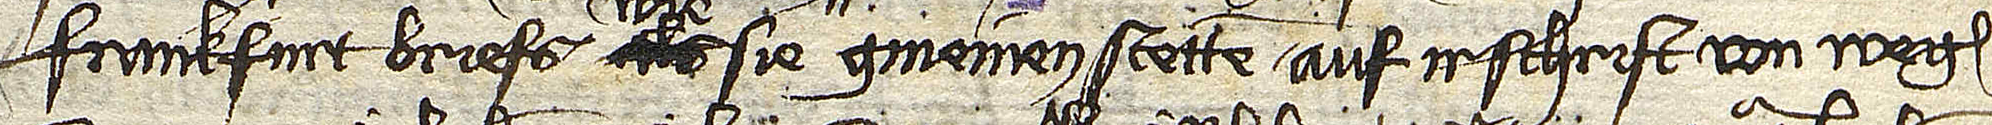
Frankfurt briefs als ſie gmeinen ſtette* / auf ir ſchrift von weg*
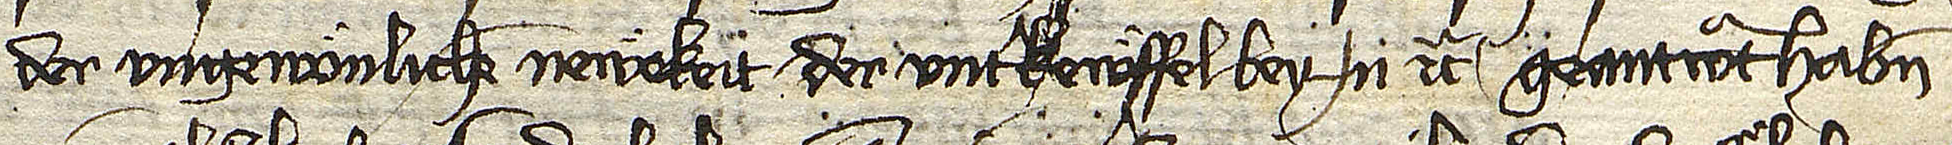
der vngewönliche* neẅekeit / der vnt*keẅffel bey In ec* geantw*t habn*
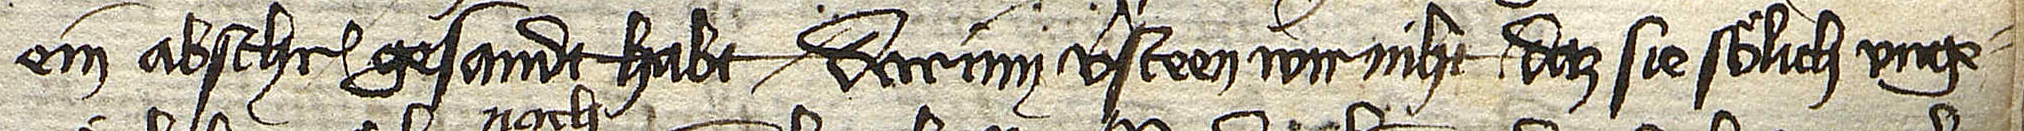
ein abſchr* geſandt habt / Darinn v*ſteen wir niht / daʒ ſie ſölich vnge =
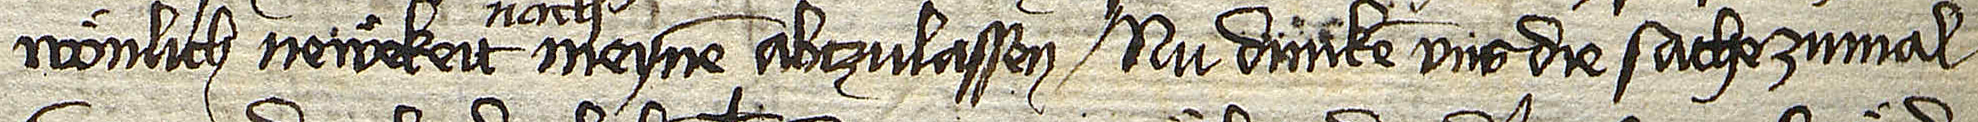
wönlich neẅekeit meyne* abcʒulaſſen / Nu danke* vns die ſache ʒumal
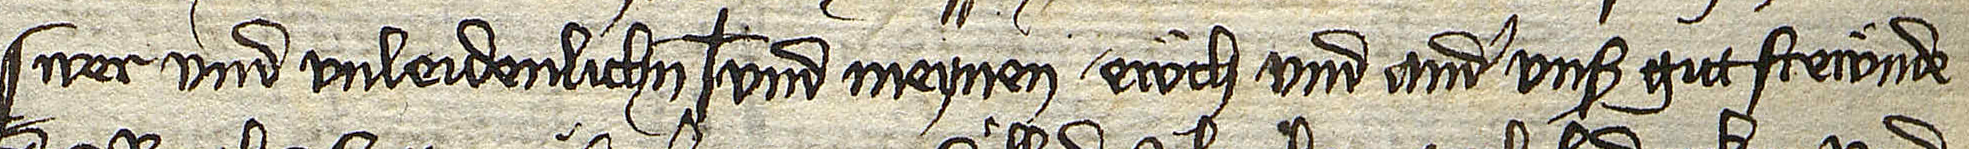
ſwer vnd vnleidenlichn* vnd meynen / eẅch vnd and* vnſ* gut freẅnde
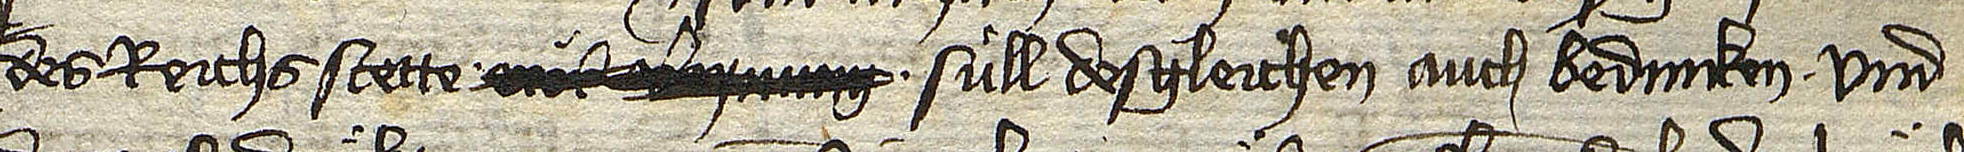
des Reichs ſtette eẅr* v*eynung . ſüll deſgleichen auch bedunken . Vnd
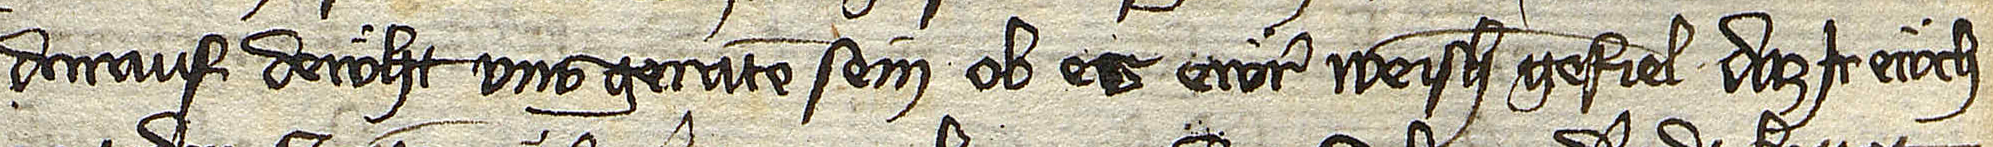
darauf deẅht vns gerate* ſein ob es eẅr* weiſh* gefiel . daʒ Ir eẅch
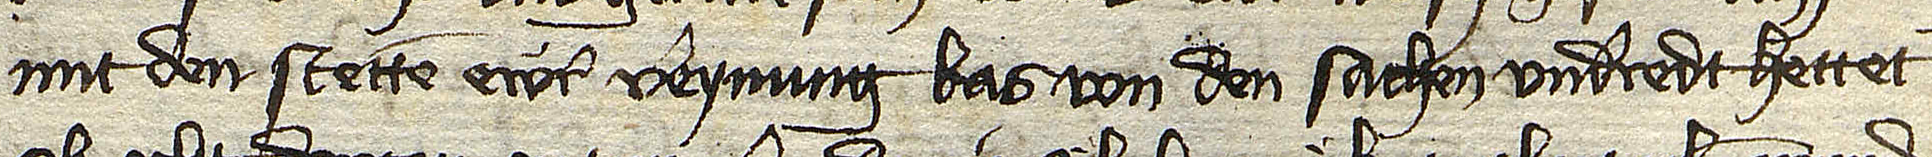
mit den ſtette* eẅr* v*eynung bas von den ſachen vnd*redt hettet
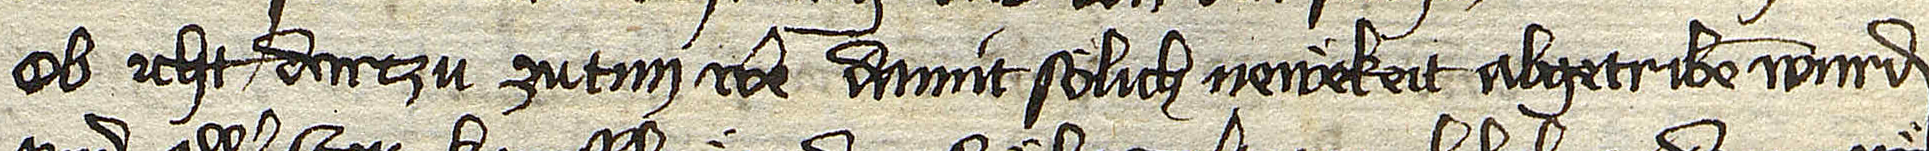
Ob icht darcʒu ʒutun w*e Damit ſölich neẅekeit abgetribe* wurd*
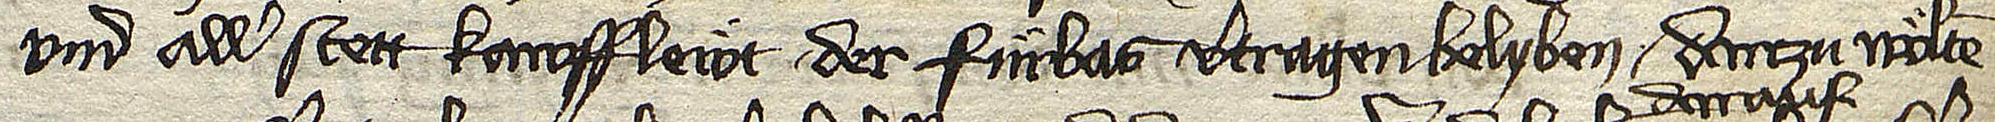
vnd all* ſtett kawffleẅt / der fürbas v*tragen belyben / darcʒu wölte*
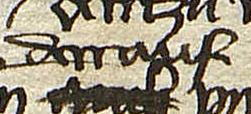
darauf
